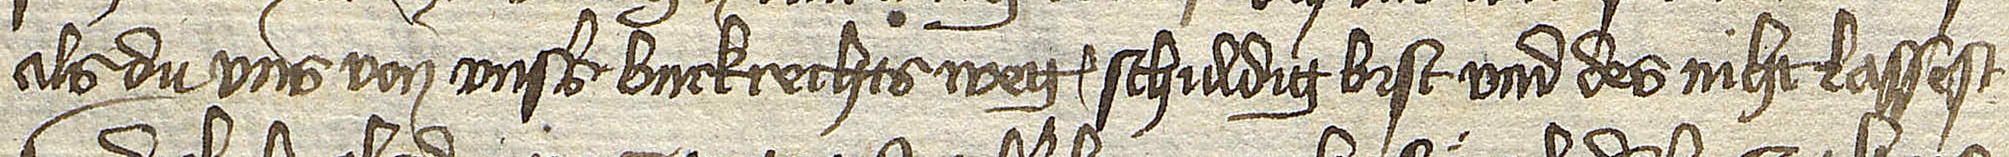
als du vns von vnſ*s burkrechts weg* ſchuldig biſt vnd des niht laſſeſt
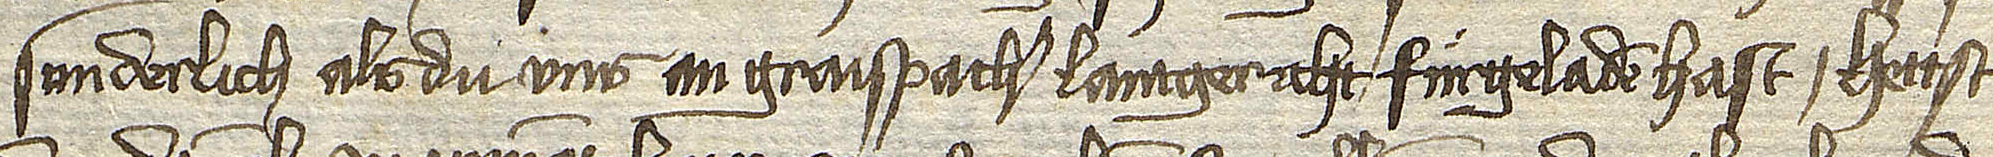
ſunderlich als du vns an graiſpach* lantgericht fürgelade* haſt / hettſt
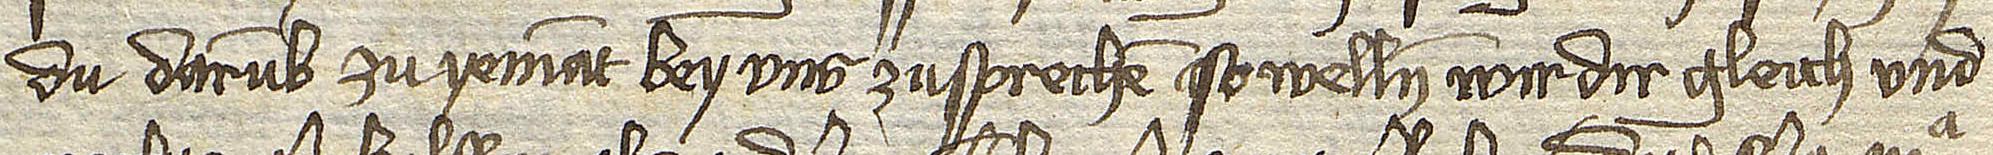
du darub* ʒu yema*t bey vns ʒu ſpreche* ſo welln* wir dir gleich vnd
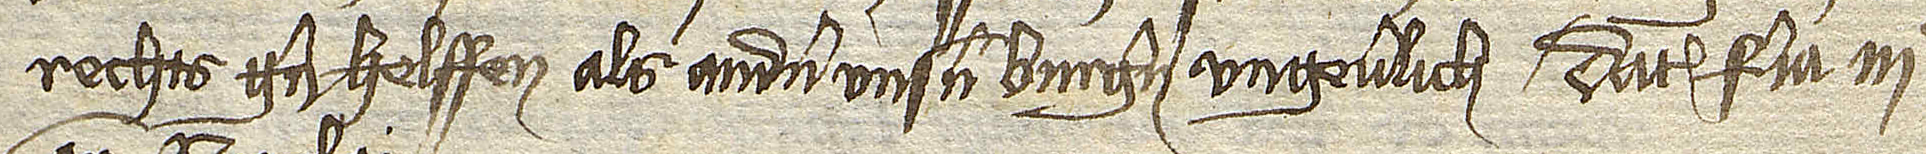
rechts g*n helffen als andn* vnſn* burg*n vngeu*lich / Dat* fi*a iii*
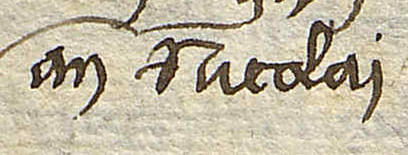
an* Nicolai
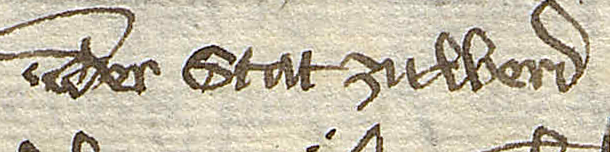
Der Stat ʒu Werd
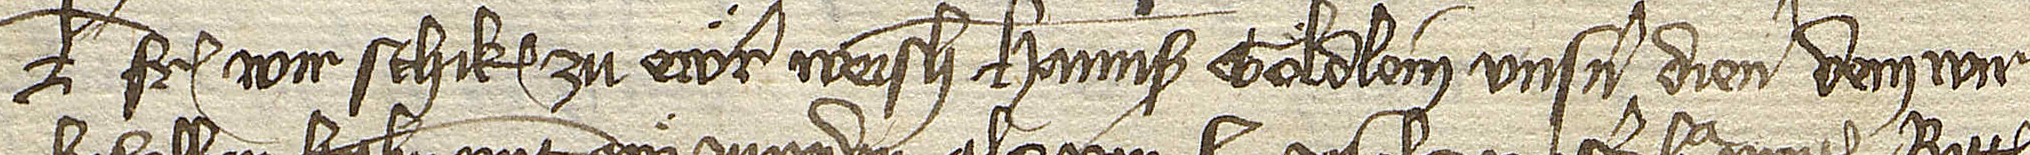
L* fr* wir ſchik* ʒu eẅr* weiſh* Hannſ* Göldlein vnſn* dien dem wir
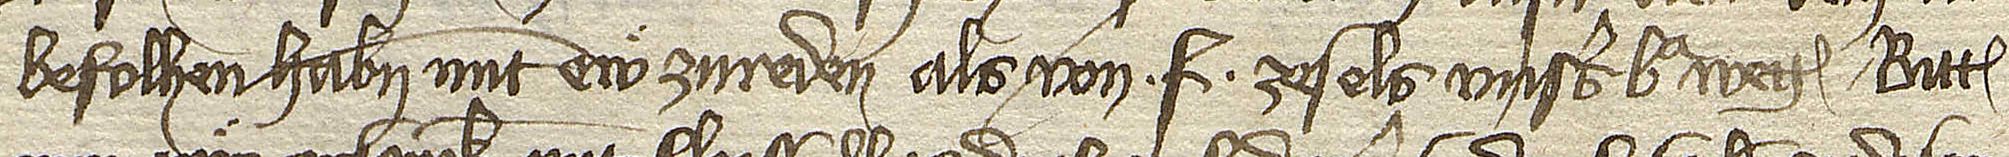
befolhen habn* mit eẅ ʒureden als von . F* . ʒefels vnſ*s b* weg* / Bitt*
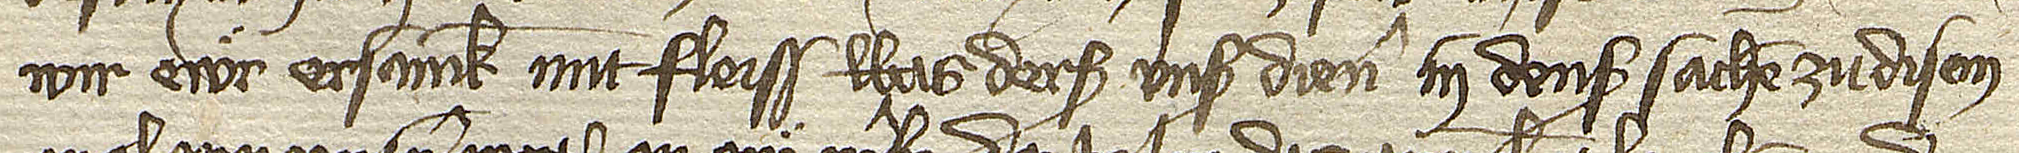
wir eẅr erſamk* mit fleiſſ was derſ* vnſ* dien* in denſ* ſache* ʒu diſem
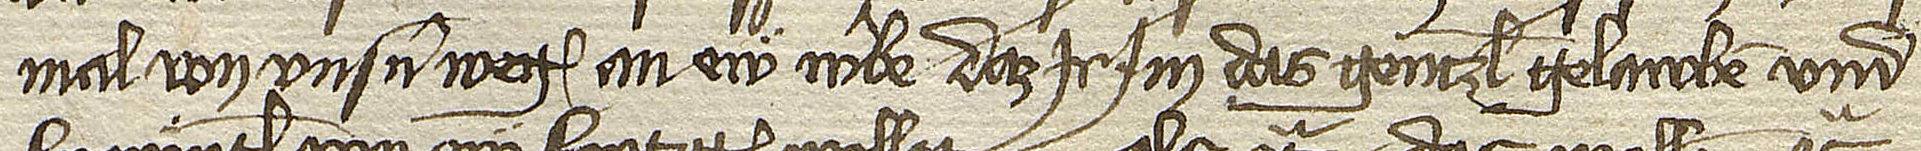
mal von vnſn* weg* an eẅ w*be Daʒ Ir Im das gencʒl* gelawbe* vnd
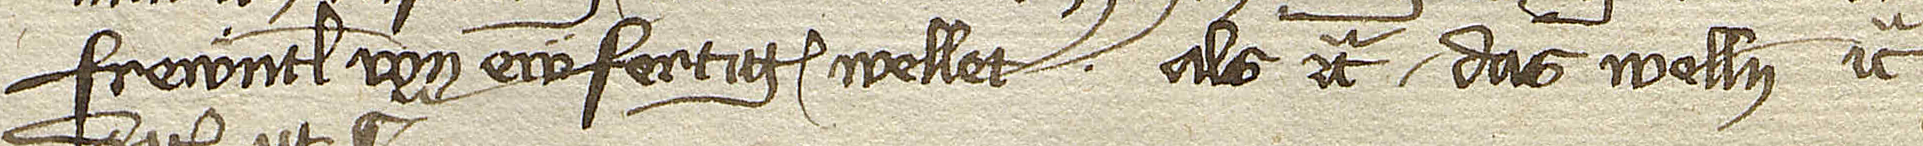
freẅntl* von eẅ fertig* wellet . als ec* / das welln* ec*
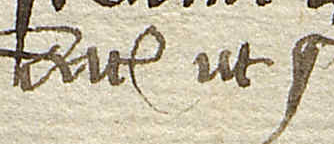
Dat* ut ſ*
